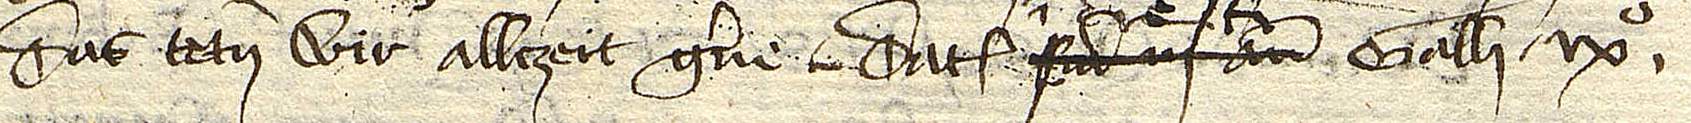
Das tetn* wir allcʒeit g*ne / Dat* fia* iii* an* Galli / ix* .
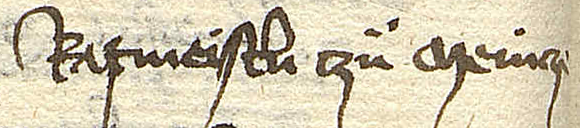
Ratmeiſtn* cʒü Meincʒe
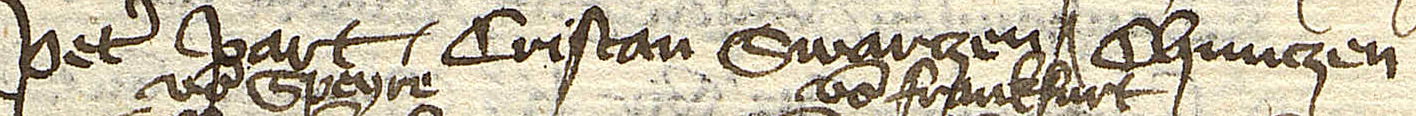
Pet* Part / Criſtan Swarcʒen Chuncʒen
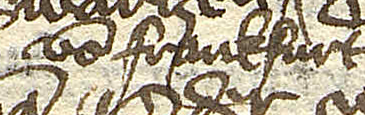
vo* frankfurt
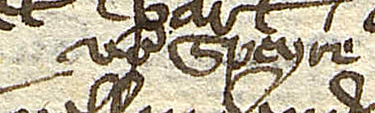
vo* Speyre
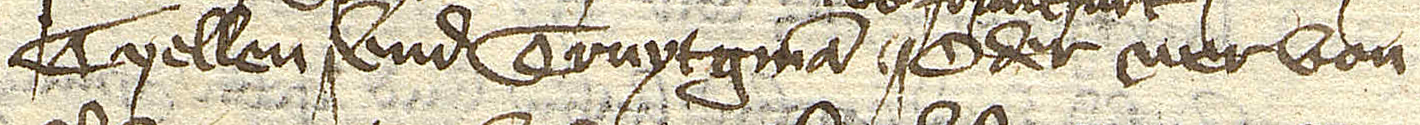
Tyellen vnd Truytg%a* / Oder wer von
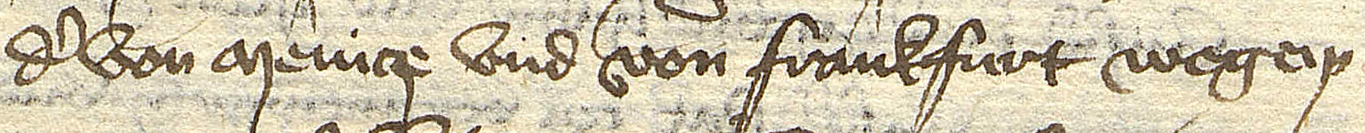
d* von Meincʒe vnd von frankfurt wegen
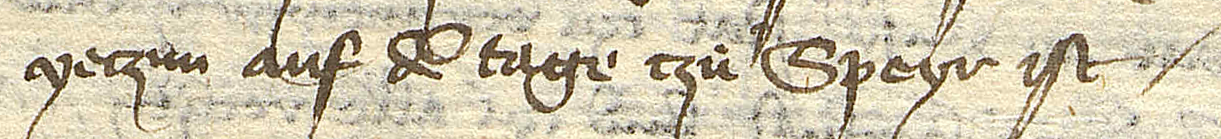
yecʒun auf d* tage cʒü Speyr iſt /
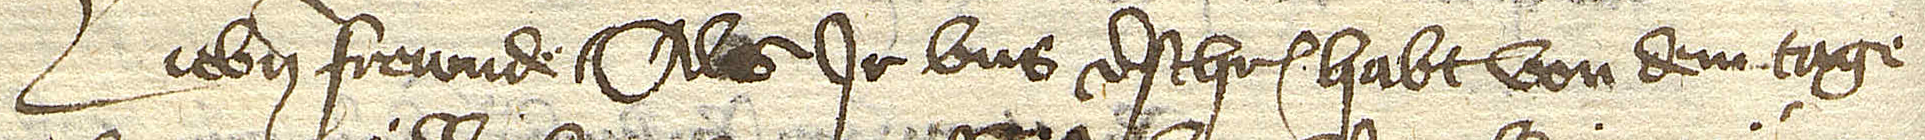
Liebn* freunde / Als Ir vns v*ſchr* habt von dem tage
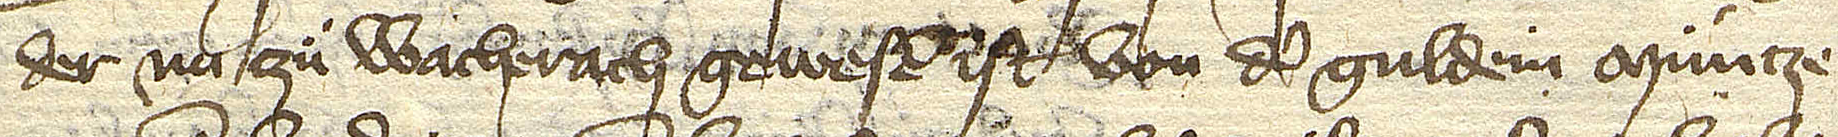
der nu cʒü Wacherach geweſe* iſt / von d* guldein Müncʒe
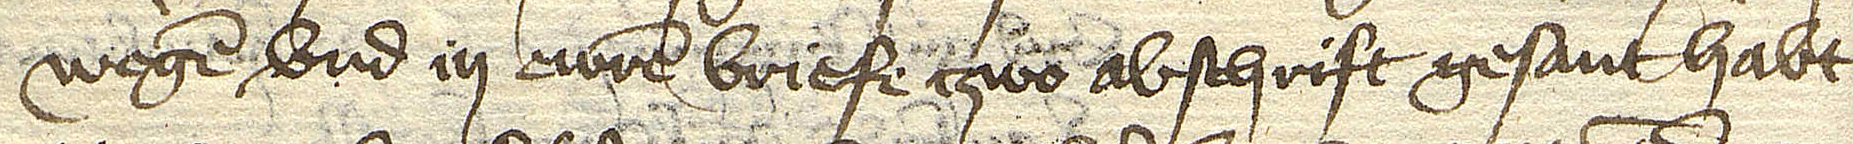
wege* vnd in ewre* briefe cʒwo abſchrift geſant habt
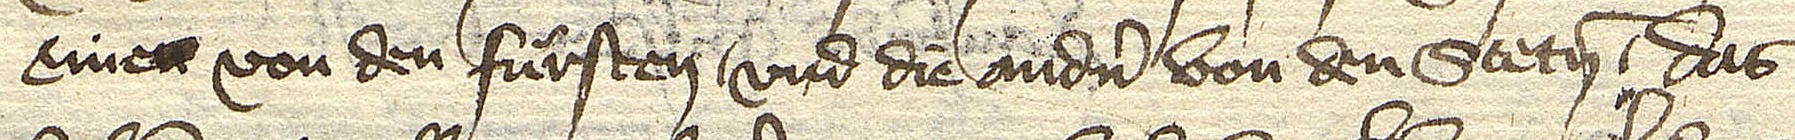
einen von den fürſten / vnd die andn* von den Stetn* / das
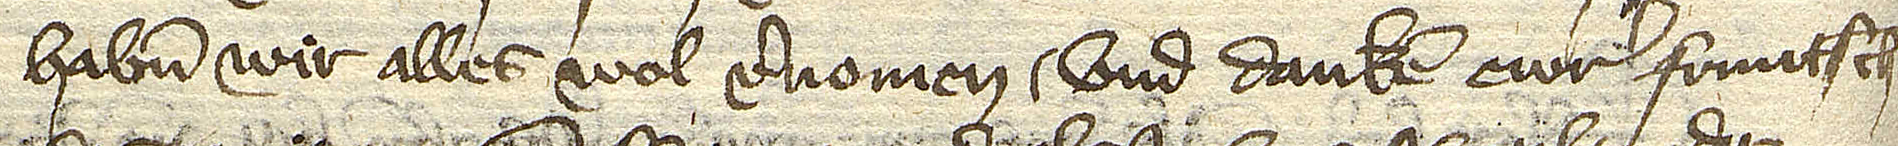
habn* wir alles wol v*nomen / vnd danke* ewr* fruntſch*
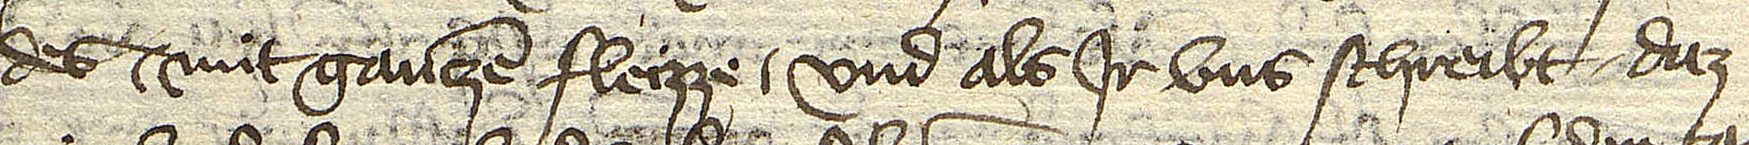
des / mit gancʒe* fleiʒʒe / vnd als Ir vns ſchreibt / daʒ
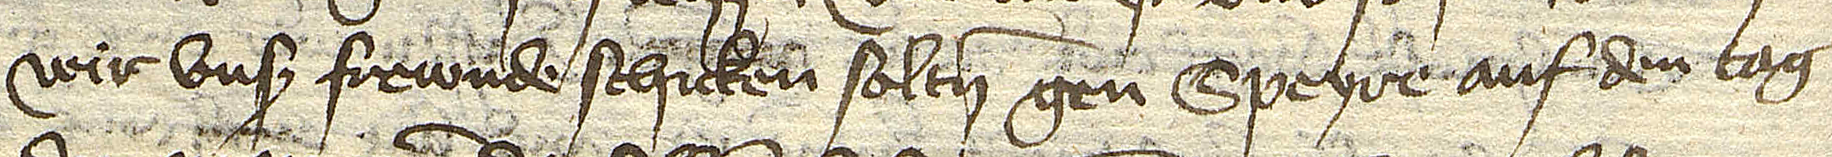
wir vnſ* frewnde ſchicken ſoltn* gen Speyre auf den tag
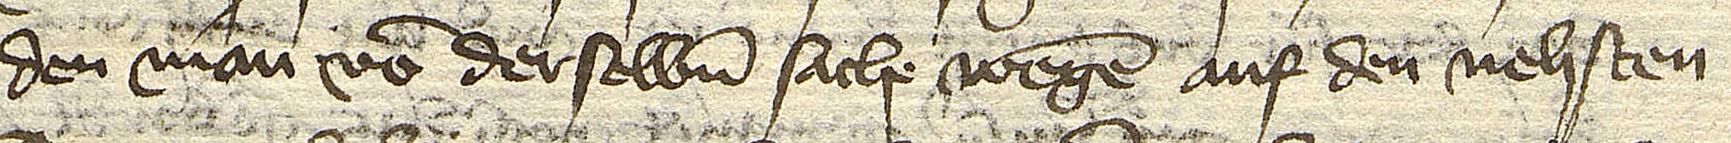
den man vo* der ſelbn* ſache wege* auf den nehſten
